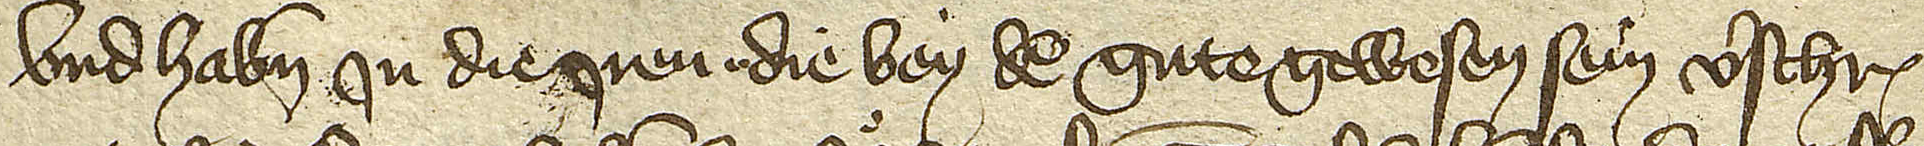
vnd habn* In die Iren ~ die bey d* gute geweſen ſein v*ſchr*
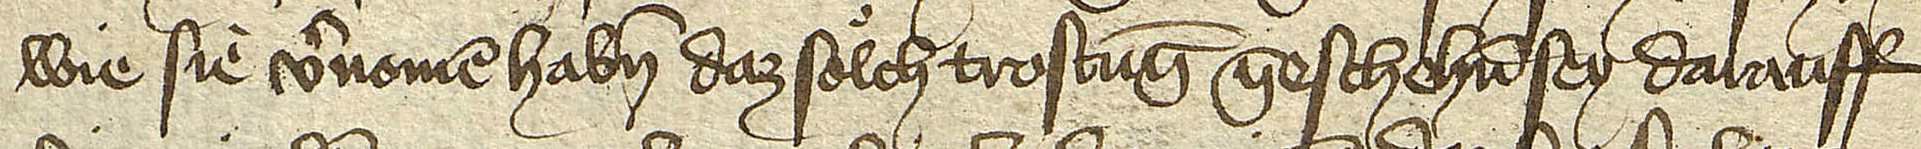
wie ſie v*nome* habn* daʒ ſölch troſtug* geſchehn* ſey darauff
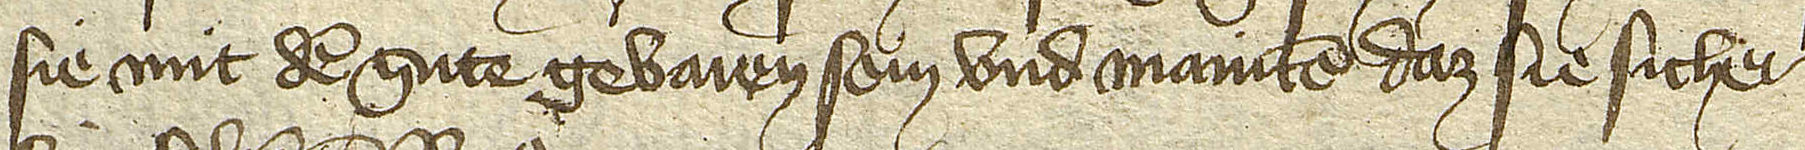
ſie mit d* gute gevaren ſein vnd mainte* daʒ ſie ſicher
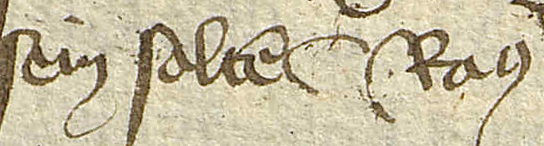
ſein ſolte* / Ro*
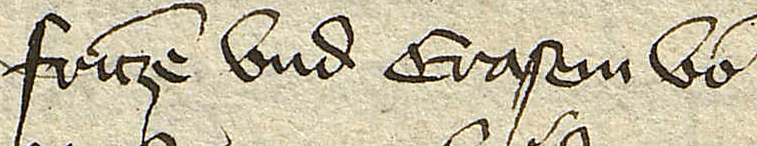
fricʒe* vnd Eraſem vo*
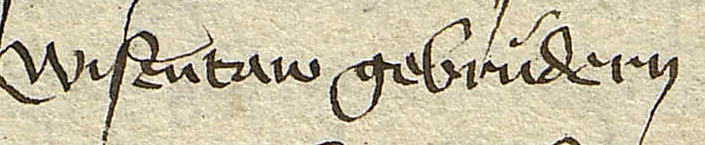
wiſentaw gebrüdern
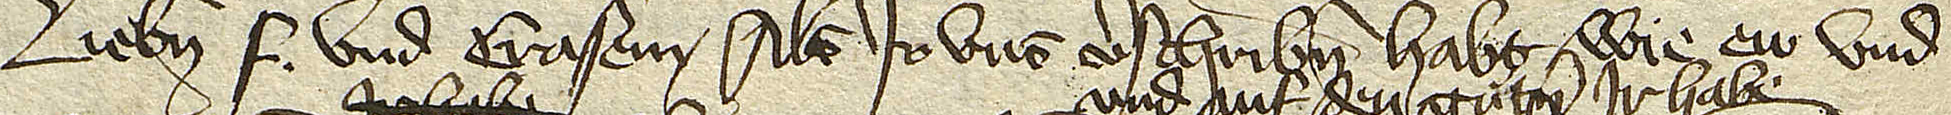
Liebn* F . vnd Eraſem / Als Ir vns v*ſchribn* habt / wie ew vnd
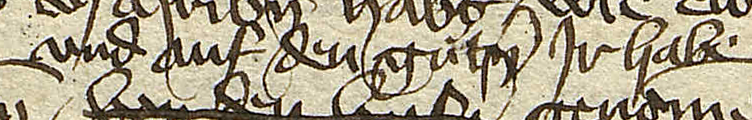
vnd auf den gütn* Ir habe
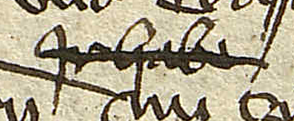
Ir habe
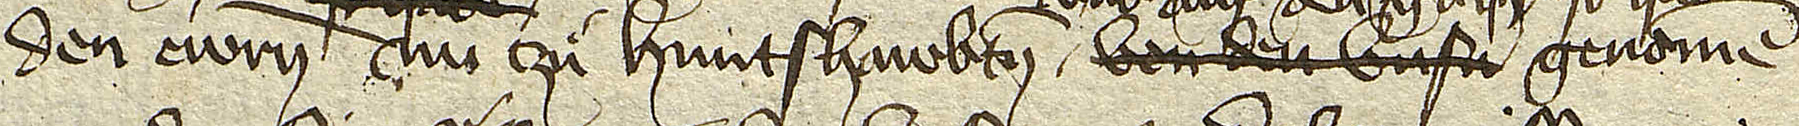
den ewrn* nu cʒü huntſhawbtn* / von den vnſn* genome*
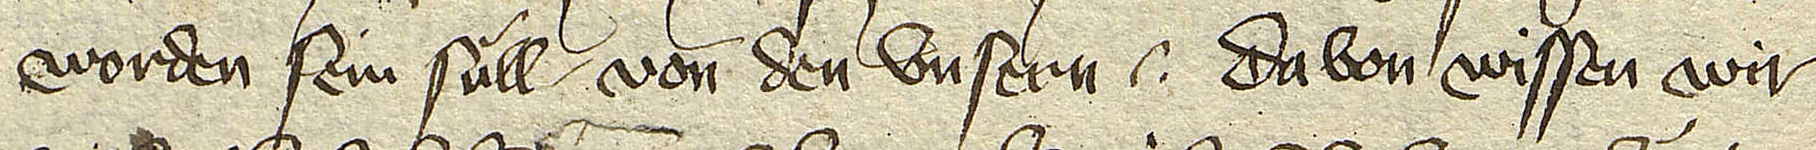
worden ſein ſüll / von den vnſern / . Da von wiſſen wir
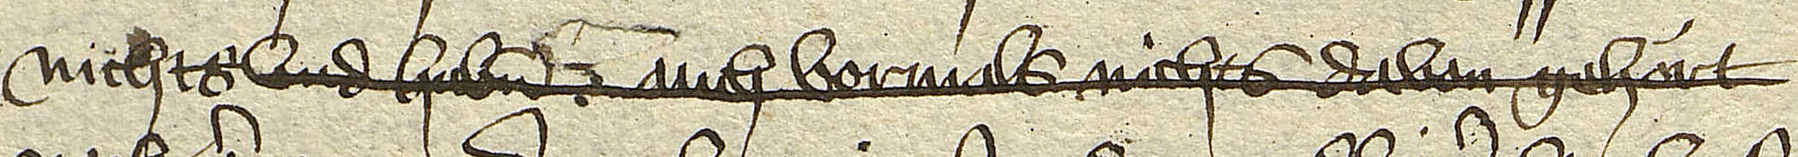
nichts vnd habn* auch vormals nichts davon gehört
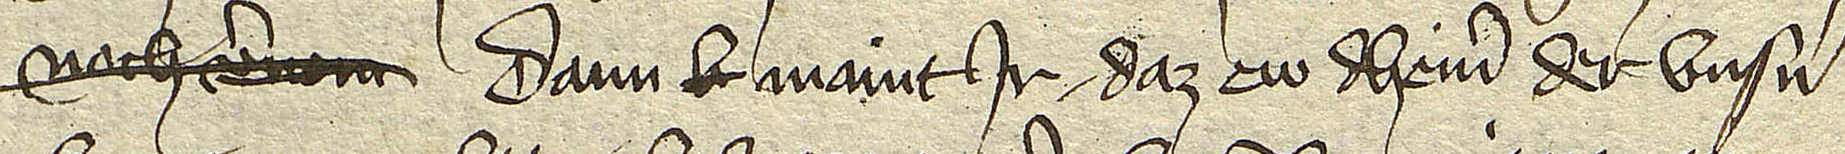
noch v*nom Dann h maint Ir / daʒ ew dhein* der vnſn*
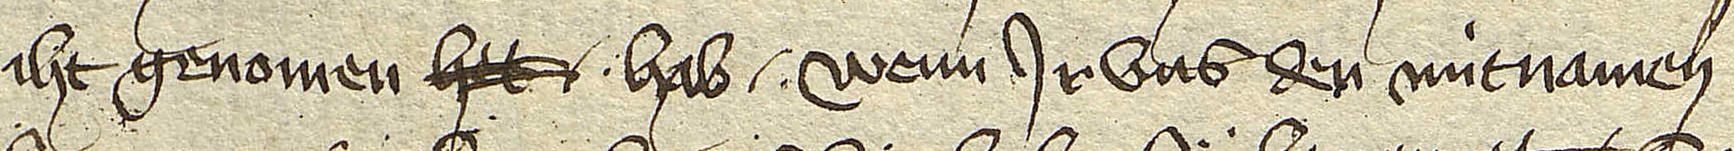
iht genomen het / . hab / . wenn Ir vns den mitnamen
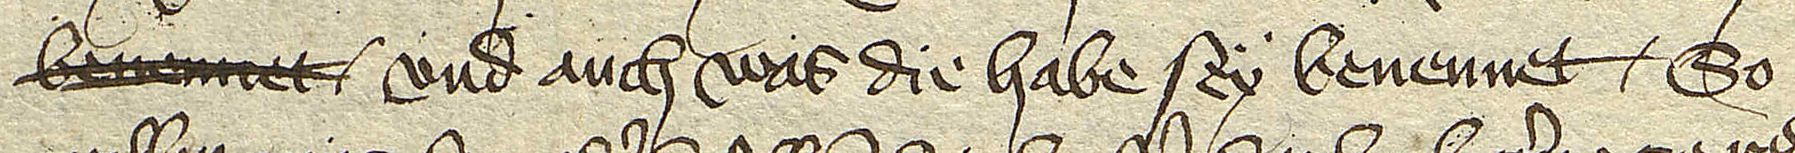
benennet / vnd auch was die habe ſey benennet / So
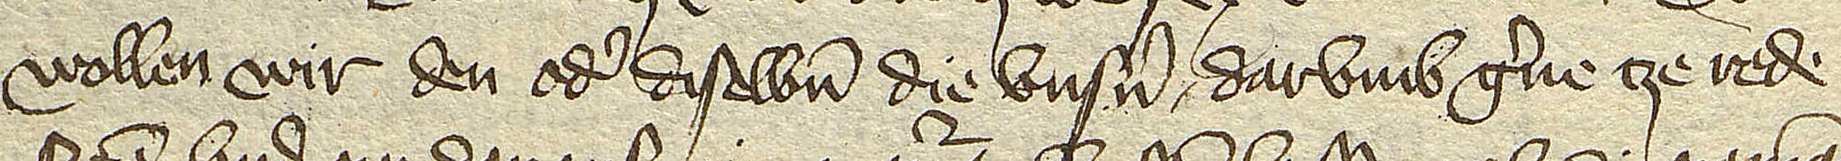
wollen wir den od* diſelbn* die vnſn* / darvmb g*ne cʒe rede
